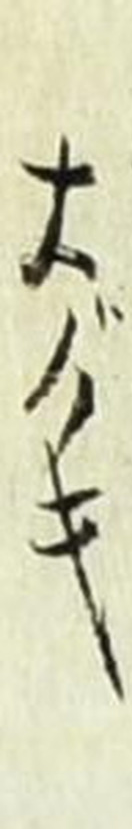大グキ
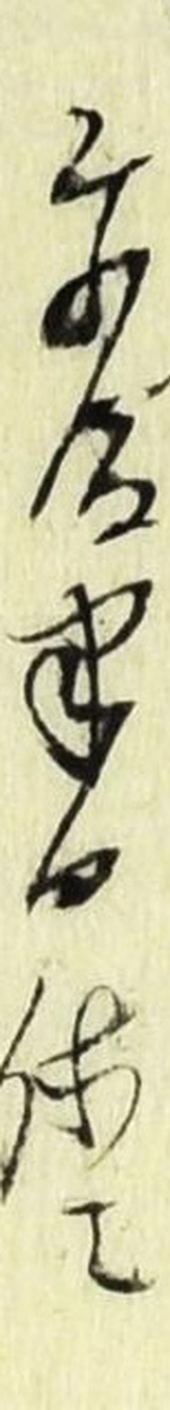午後半日休ミ
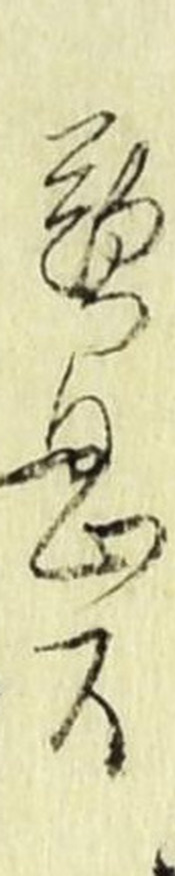歎息ス
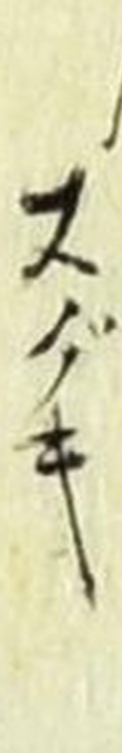大グキ
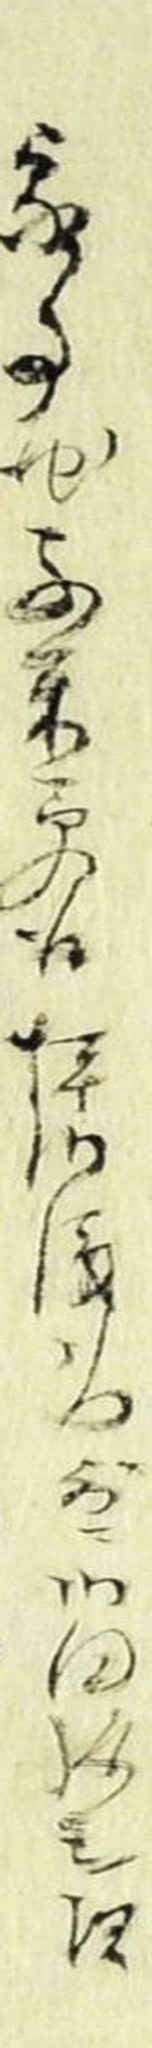家事地子米受取坪川浅右衛門外ニ内田弥三次
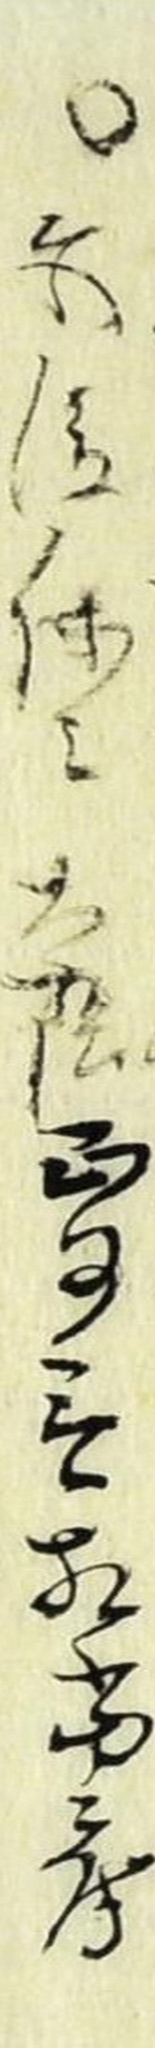○午後休ミ大陰暦正月三日相当ニ付
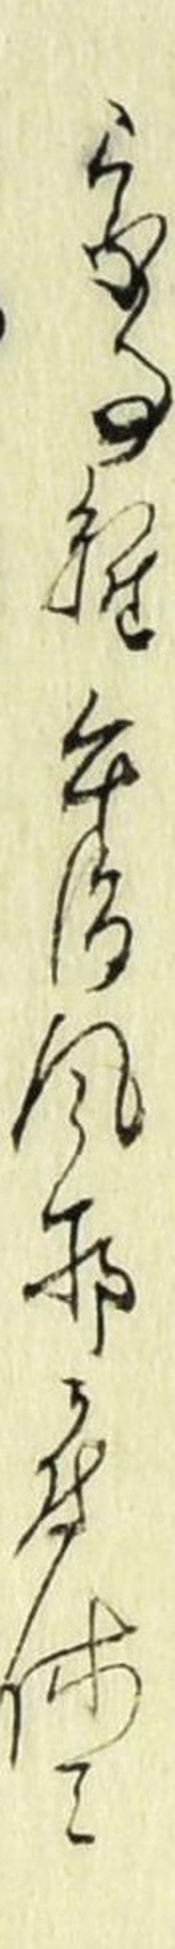家事雑午後風邪ニ付休ミ
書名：（日記）
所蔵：福井県文書館 Fukui Prefectural Archives
